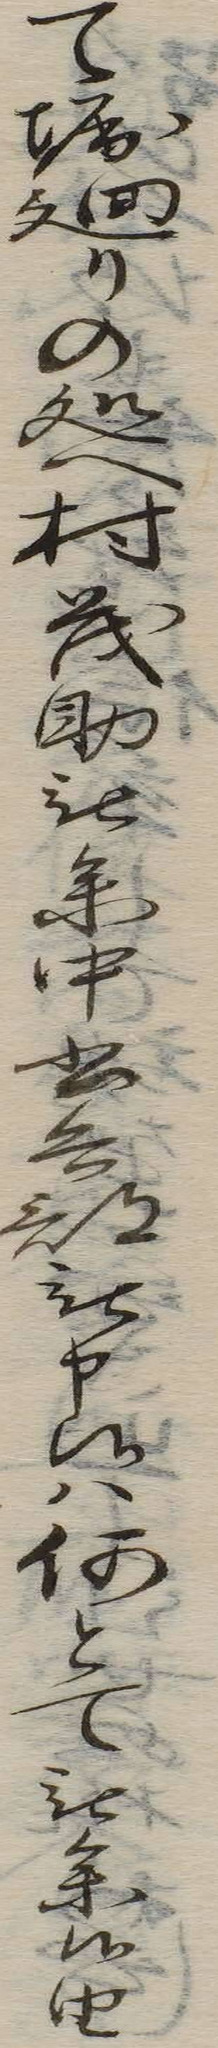て堀廻りの処へ村茂助被参中出兵部被申候は何とて被参候由
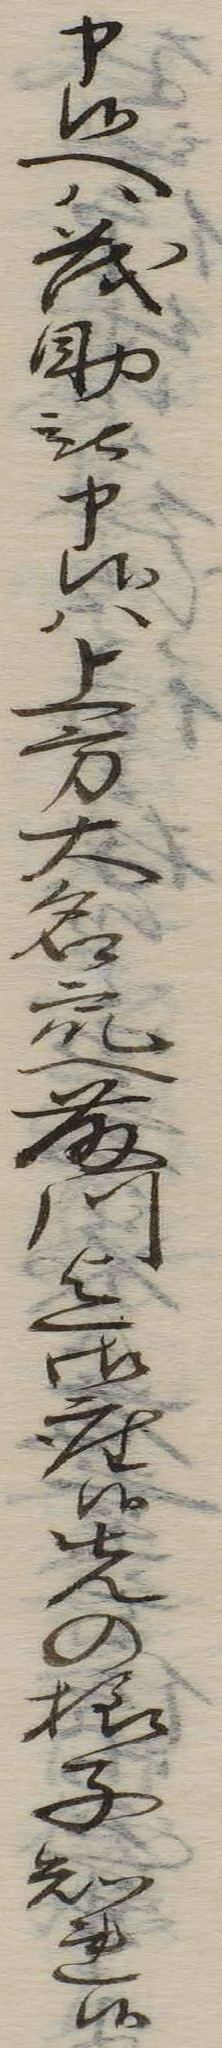申候へは茂助被申候は上方大名衆藤川迄御座候先の様子知れ候
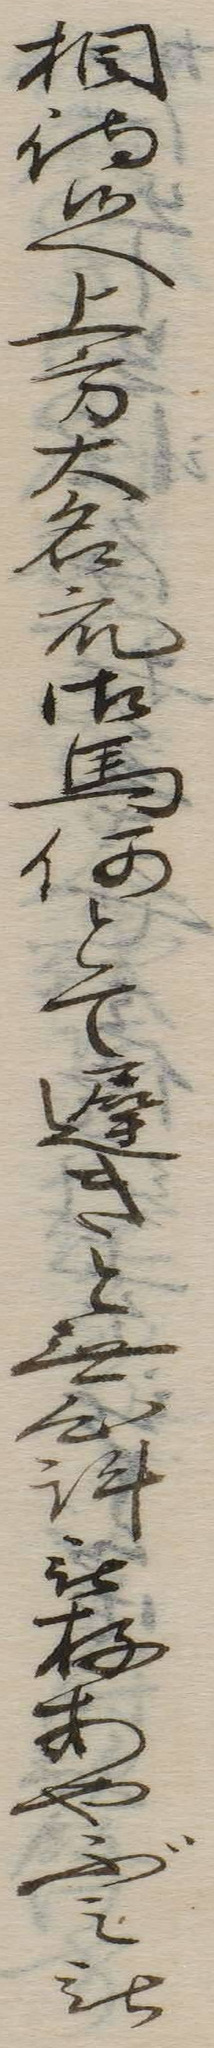相待候へ上方大名衆御馬何とて遅きと無心計被存あやぶみ被
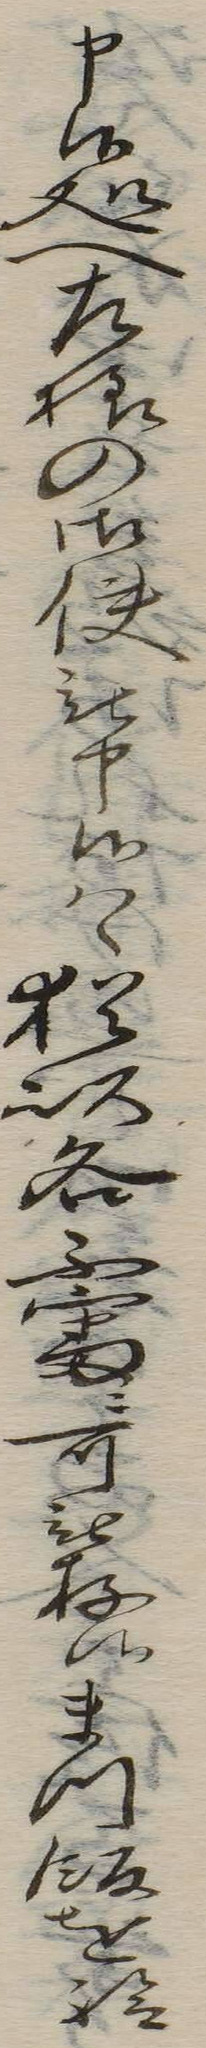申候処へ左様の御使被申候はゝ猶以各不審ニ可被存候まつ飯を給
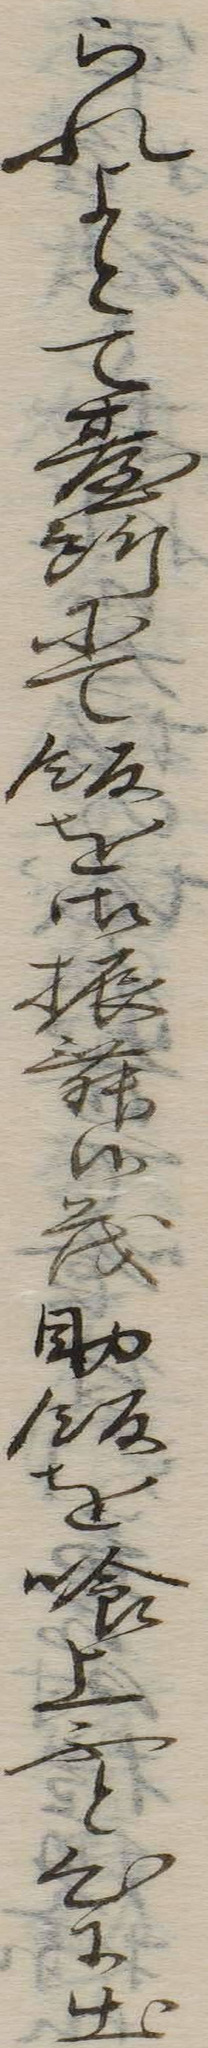られよとて台所にて飯を御振舞候茂助飯を喰上ふと心に出
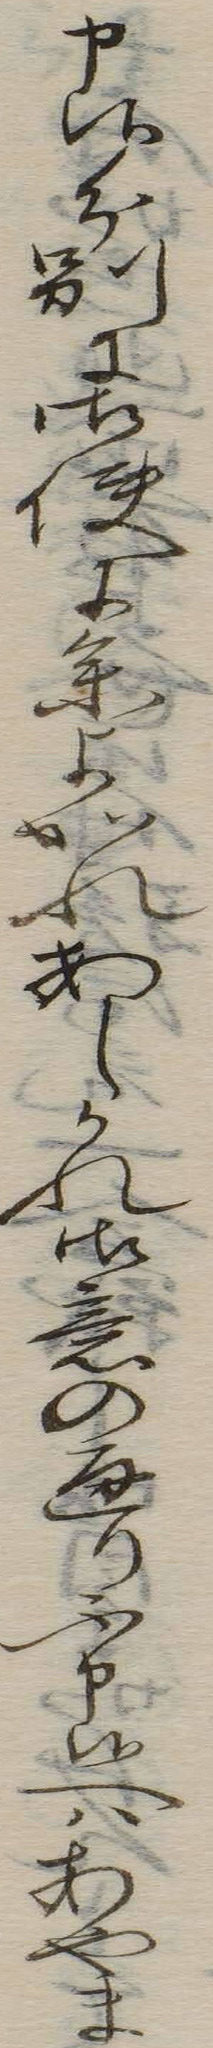申候分別に御使に参よかれあかれ御意の通り不申候へはあやま
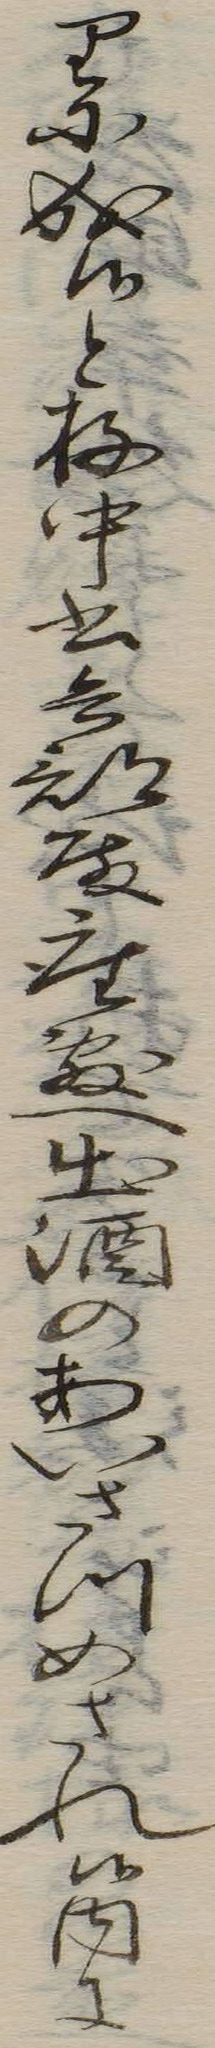りに成候と存中出兵部殿座敷へ出酒のあいさつめされ候内に
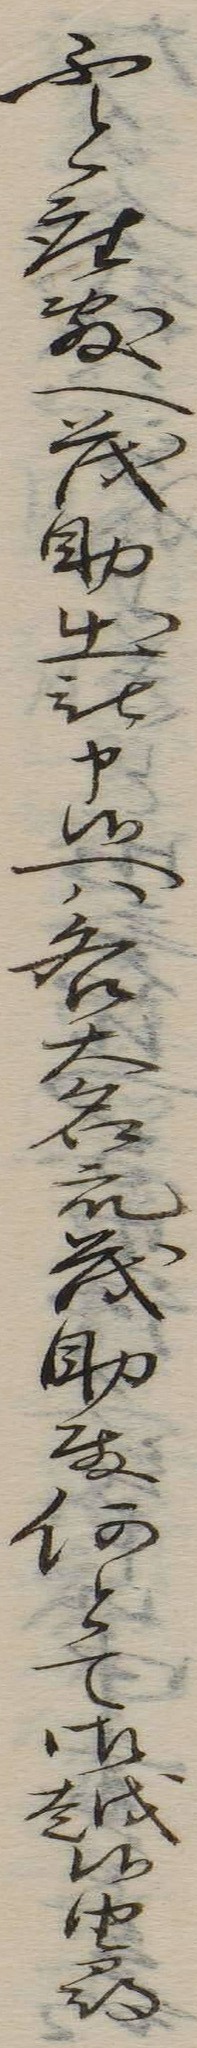ふと座敷へ茂助出被申候へは各大名衆茂助殿何とて御越御由尋
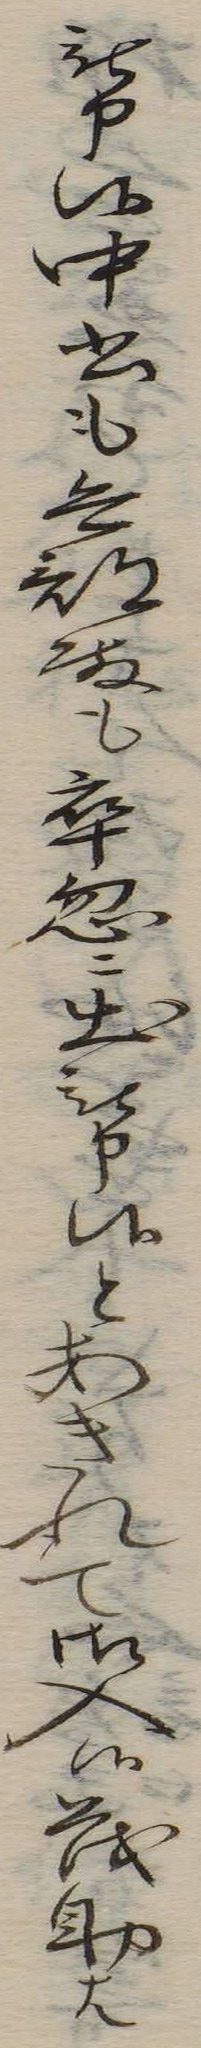被申候中出も兵部殿も卒忽ニ出被申候とあきれて御入候茂助は
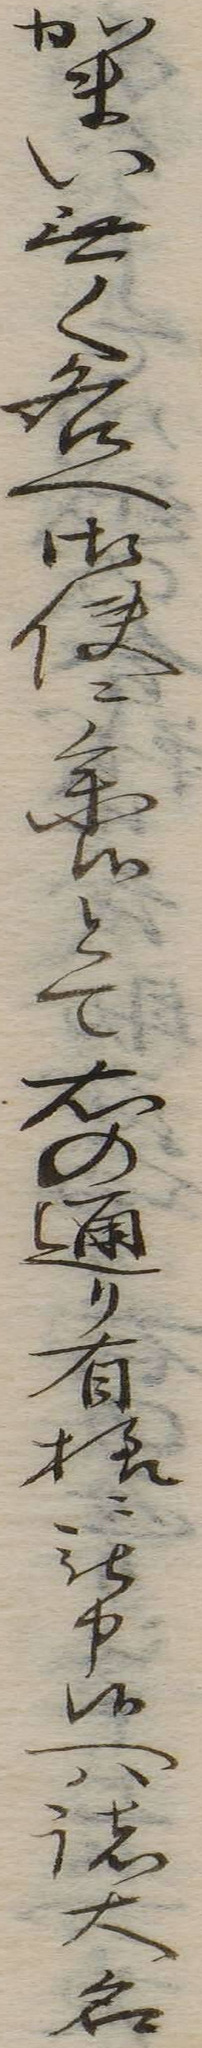かまい無く各へ御使ニ参候とて右の通り有様ニ被申候へは諸大名
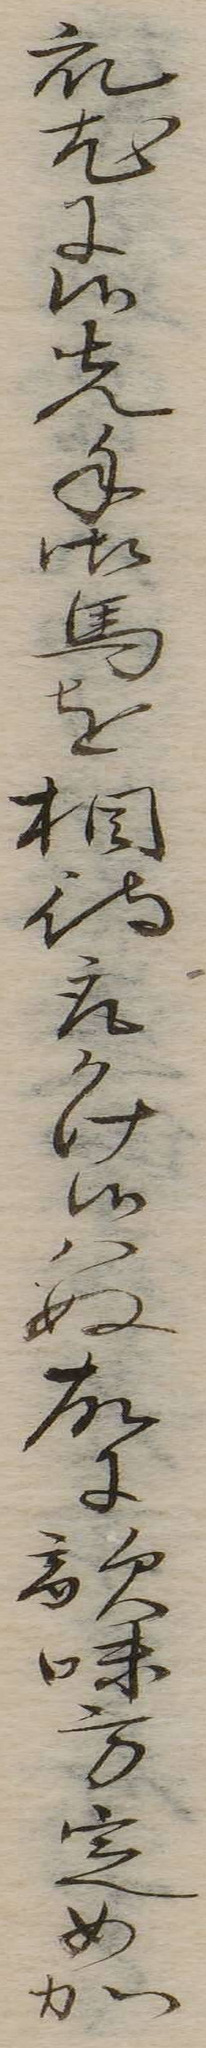衆尤に候先手御馬を相待取かけ候はぬ故に敵味方定めか

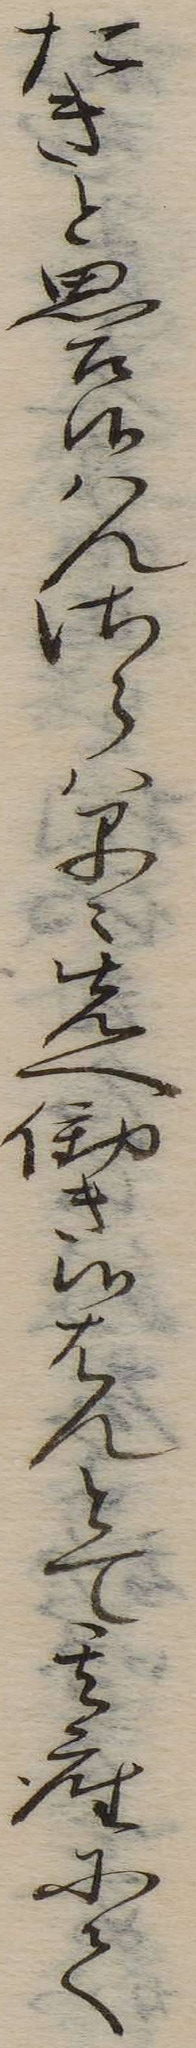たきと思召候はんさらは早々先へ働き候はんとて其座にて
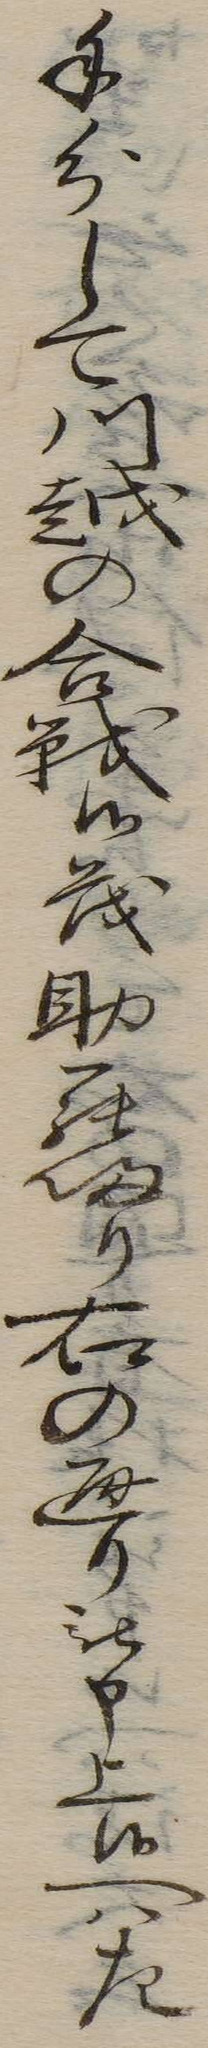手分して川越の合戦候茂助罷帰り右の通り被申上候へは左
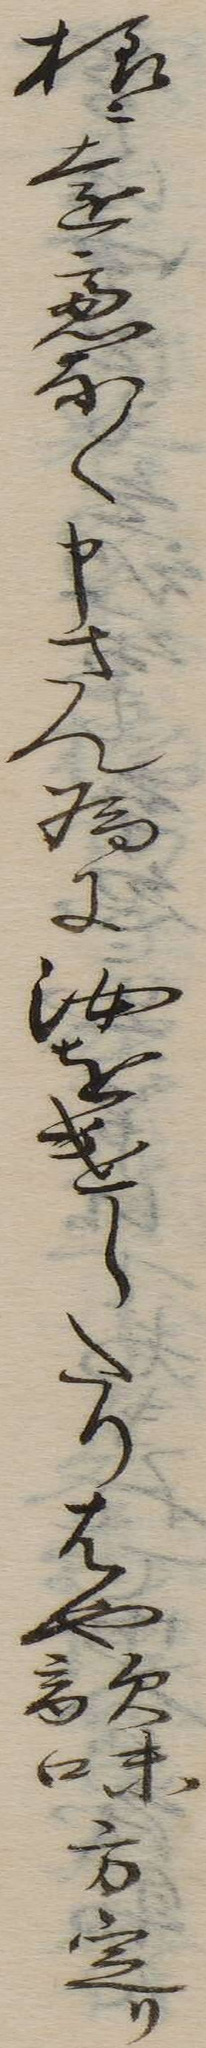様ニ遠慮なく申さん為に汝を遣したりはや敵味方定り
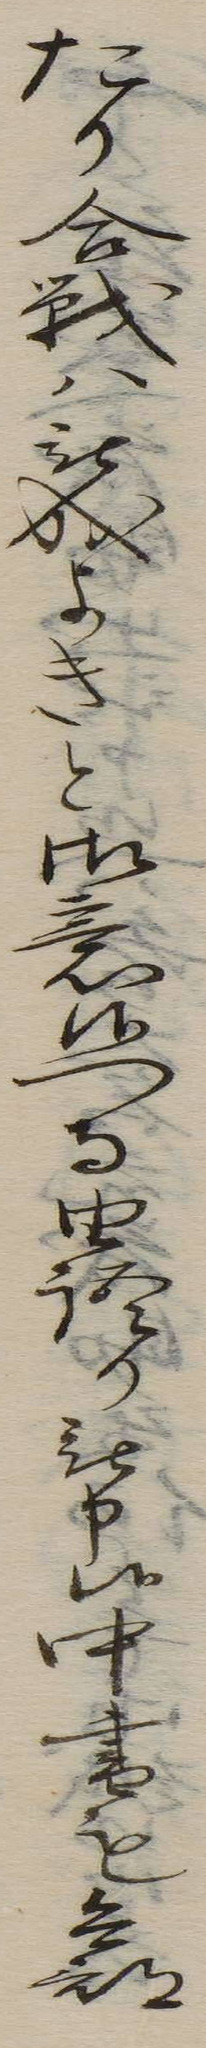たり合戦は被成よきと御意候つる由語り被申候中書も兵部
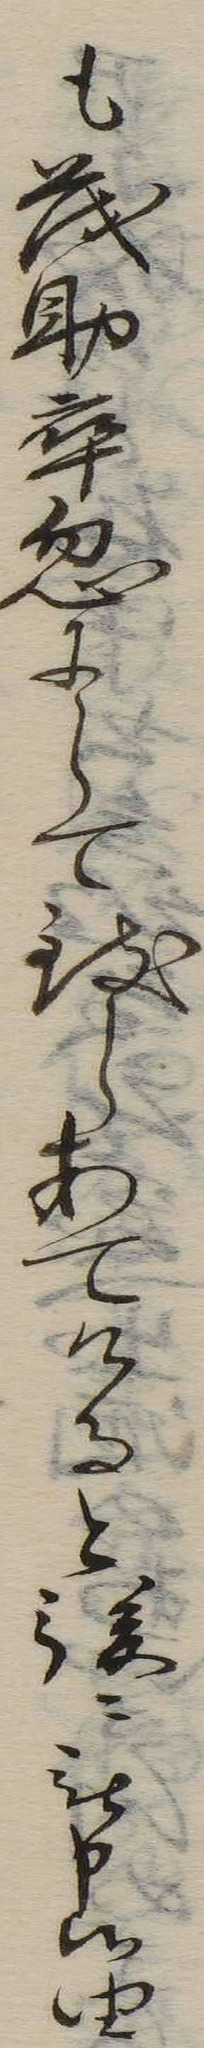も茂助卒忽にして致しあてけると後に被申候由
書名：三河之物語
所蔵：国文学研究資料館
